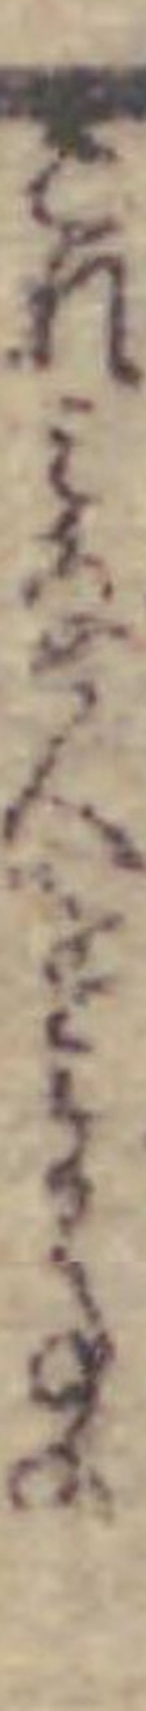これみな人をみる事の
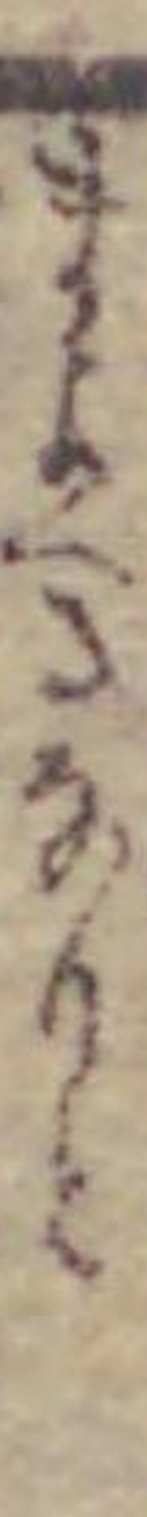まよへるなりと
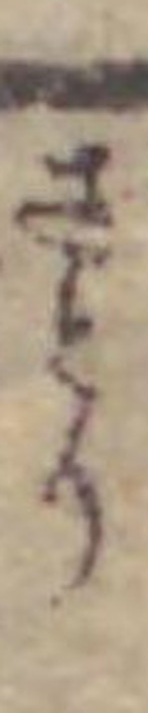さとり
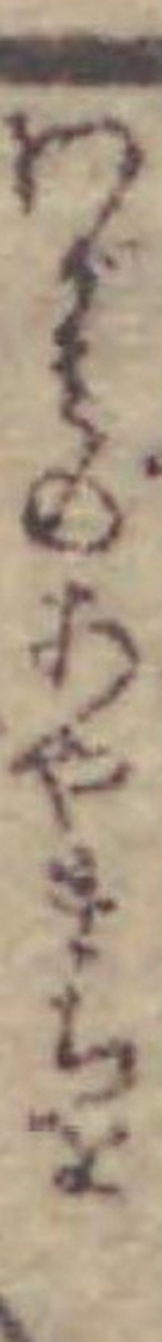わがみのあやまちを
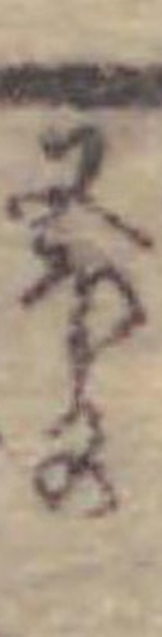又ほかの
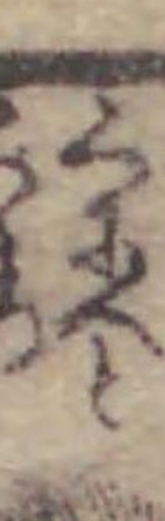くにへと

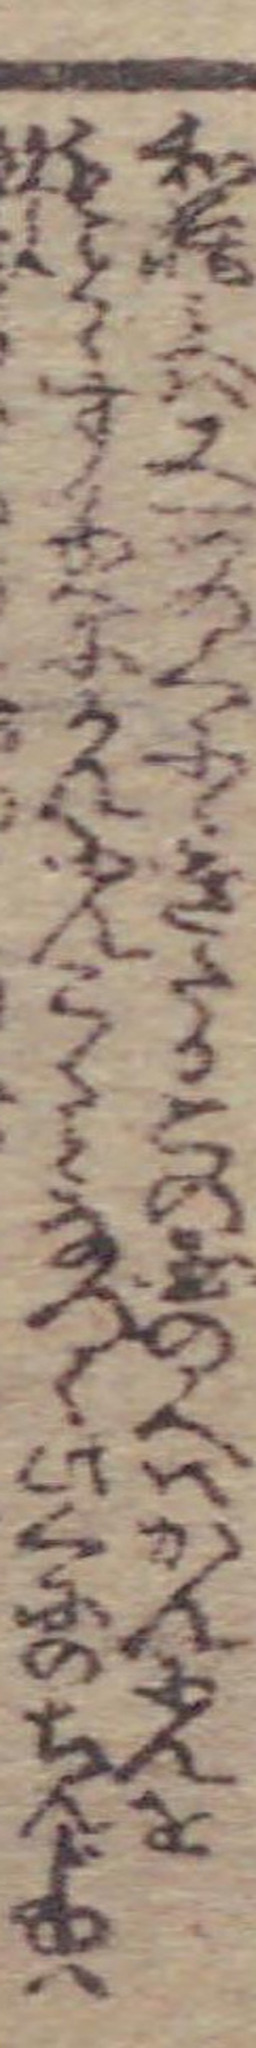もとゝするゆへにかんにんこくとなづく此くにのちんじゆは
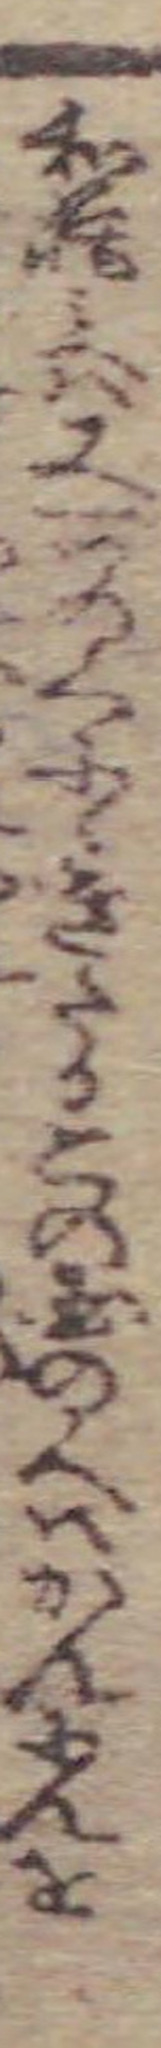和荘兵へは又一つのくにゝきたるこの国の人はかんにんを
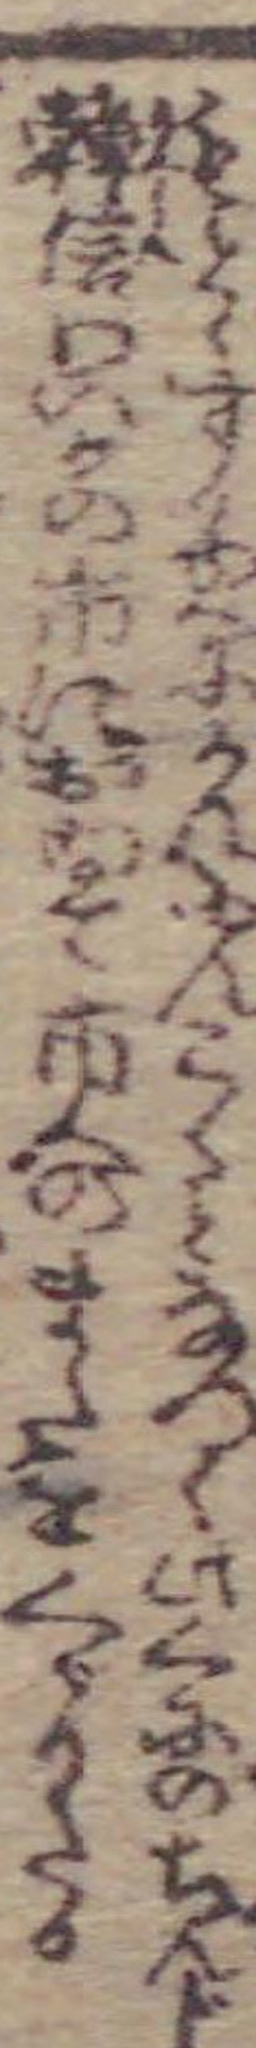韓信わいかの市におゐて市人のまたをくゞりたる
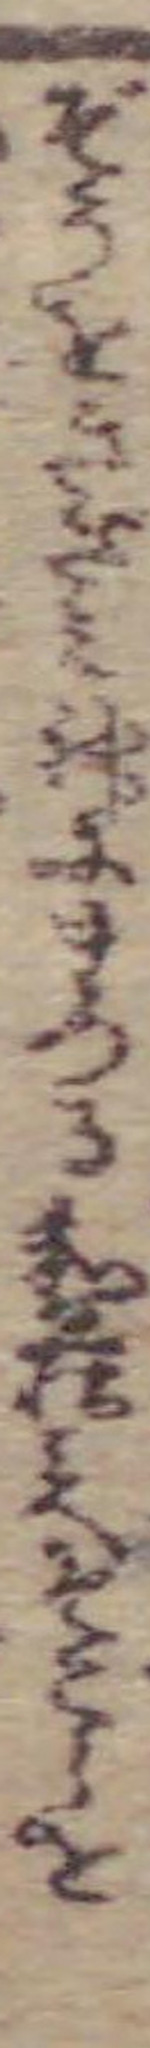ぞうをきさみ神にまつる和荘兵へそこらを
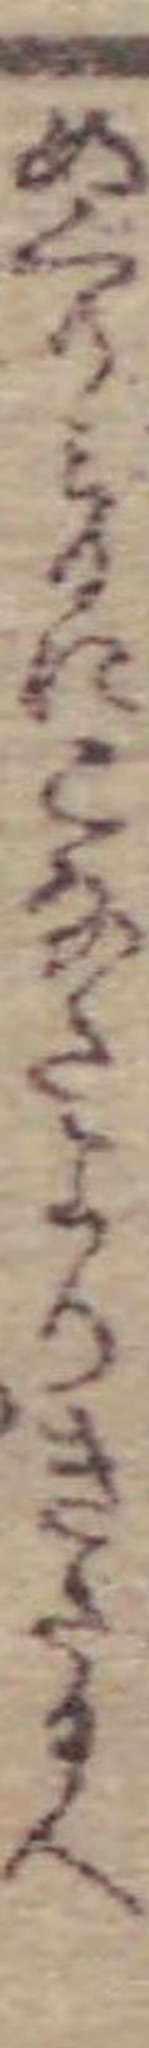めぐりみるにこなたよりきたる人
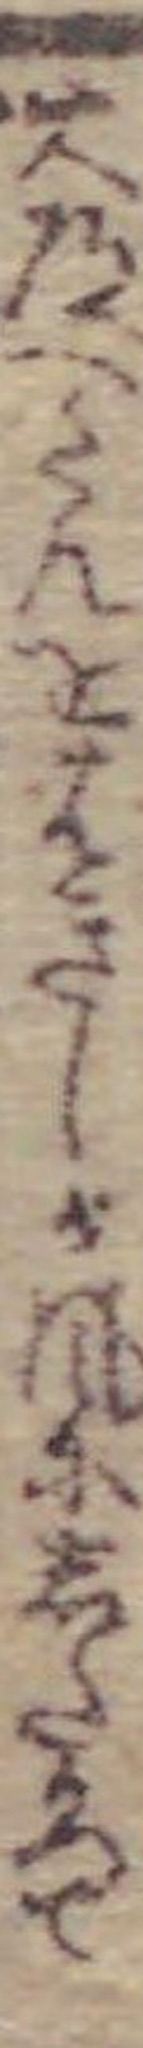大道へたんをはさしが風にしたかつて
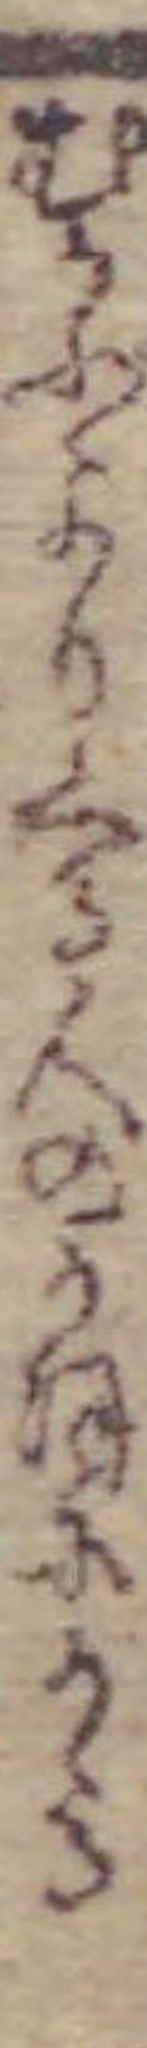むかふよりくる人のかほにかゝる
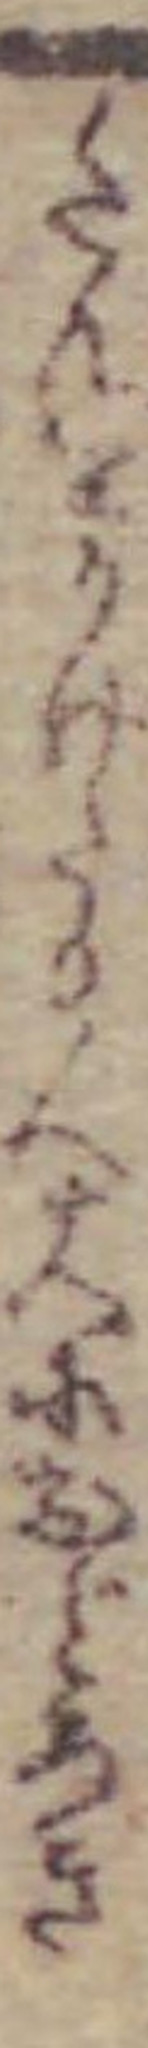たんをかけたる人大におどろき
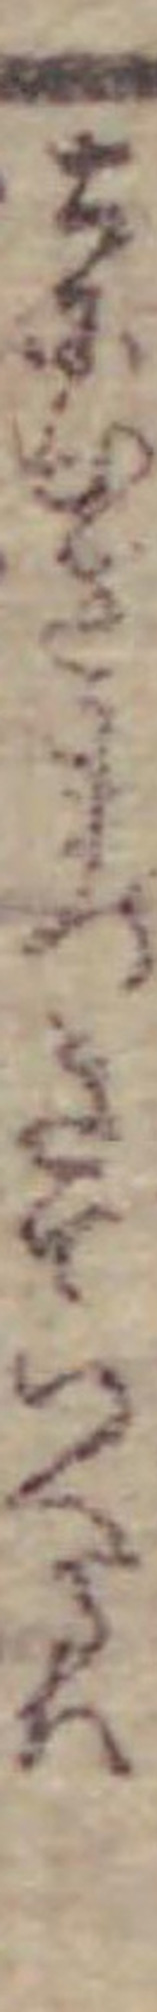土にひざまづきていへるは
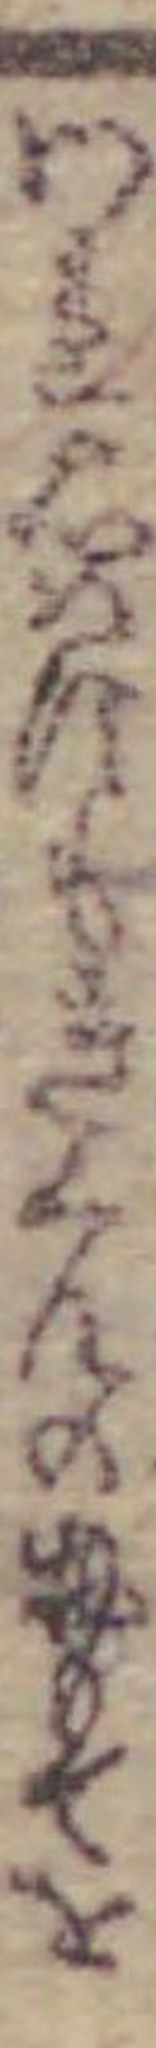われ思はずもきくんのおもてを
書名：和荘兵衛後日話 : 3巻
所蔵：国立国会図書館 National Diet Library, JAPAN
